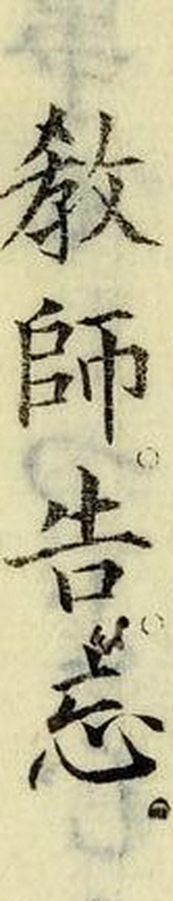教師。告。忘。
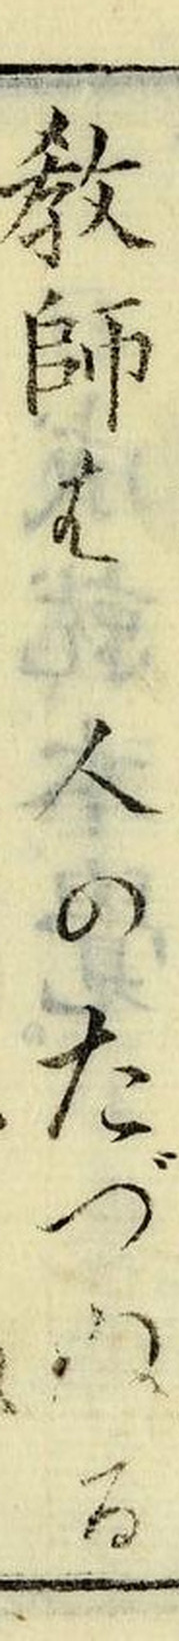教師は人のたづぬる
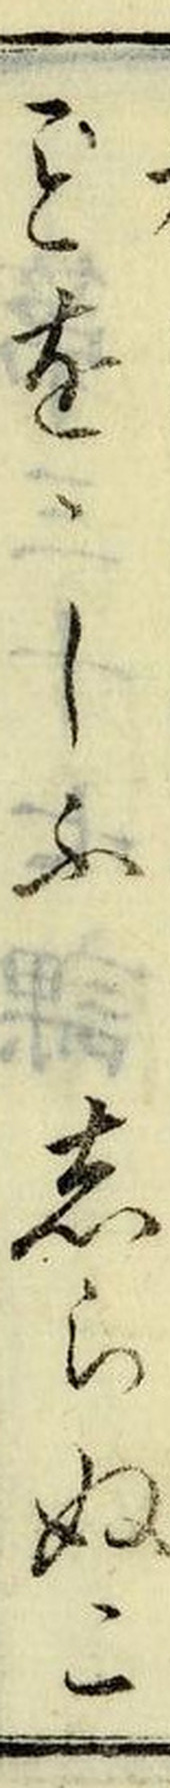ことをゝしふしらぬこ
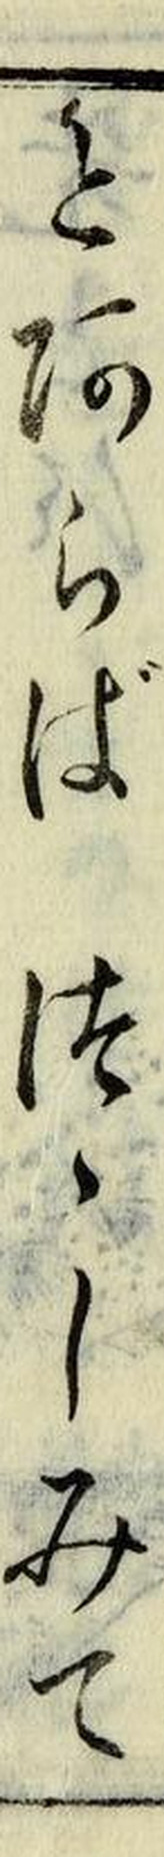とあらばつゝしみて
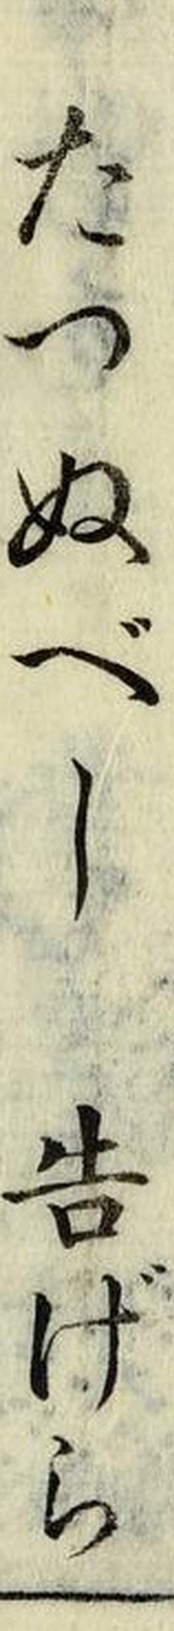たつぬべし告げら
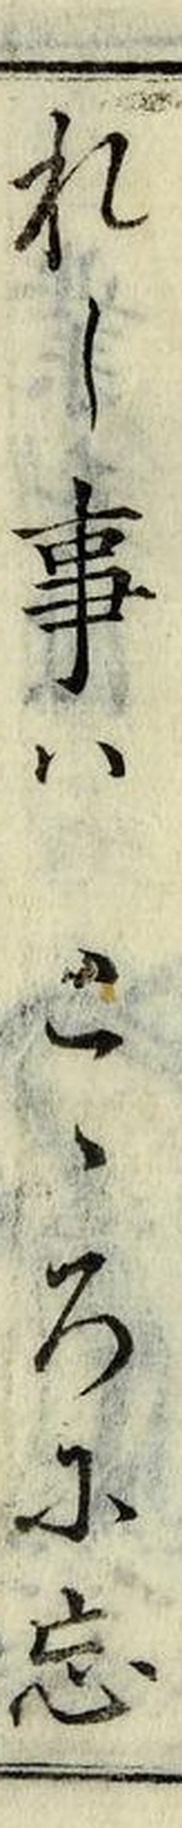れし事はこゝろに忘
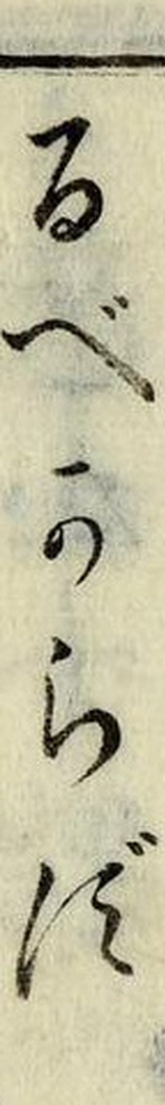るべからず
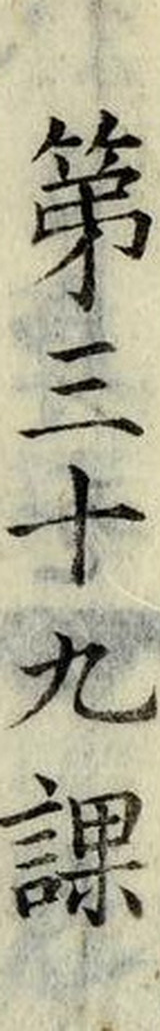第三十九課

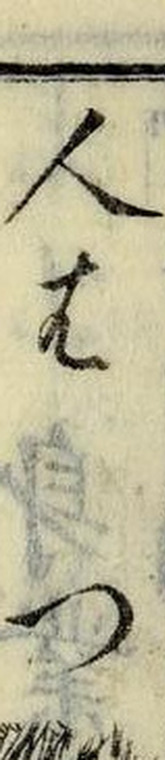人はつ
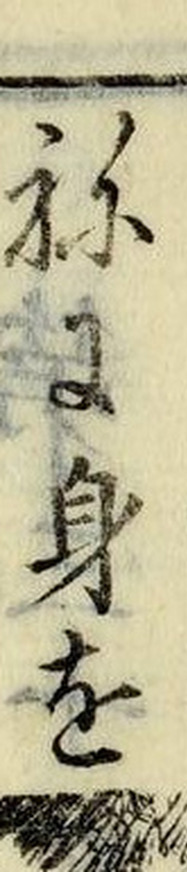ねに身を
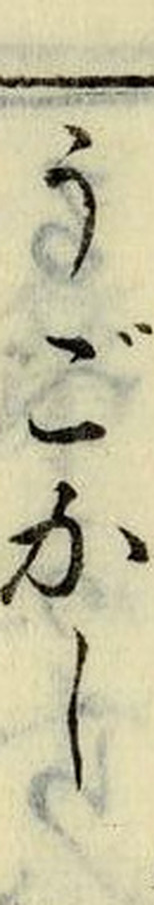うごかし
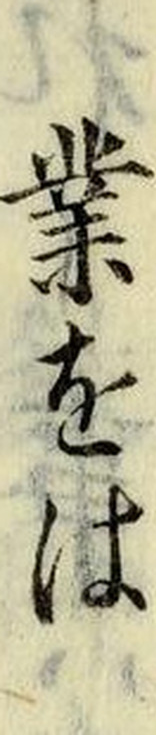業をは
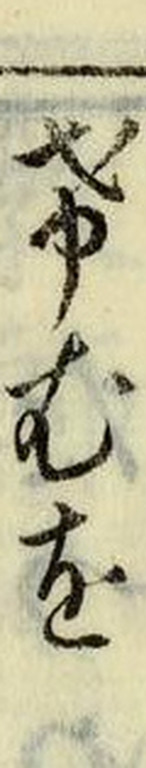げむを
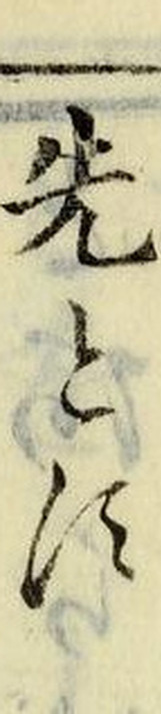先とす
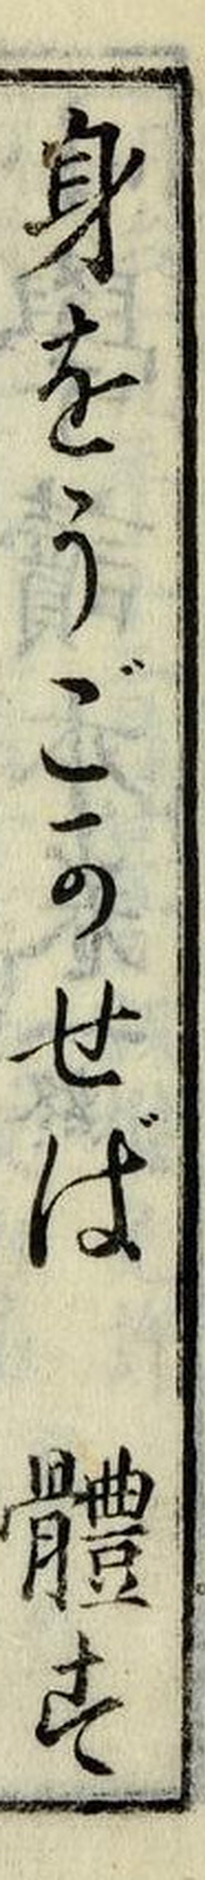身をうごかせば体す
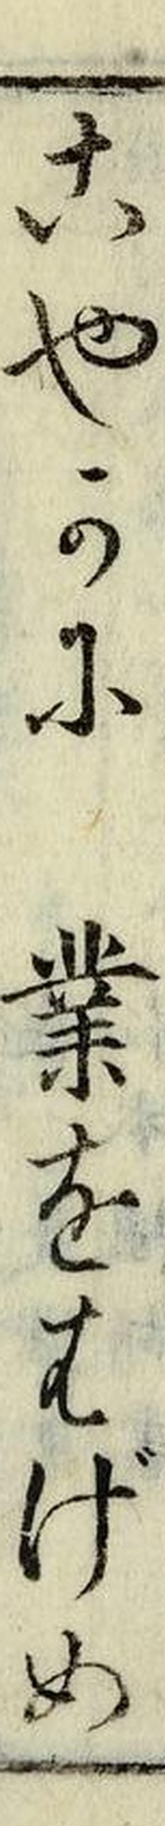こやかに業をはげめ
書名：小学読本 初等科 巻一
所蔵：福井県文書館 Fukui Prefectural Archives
